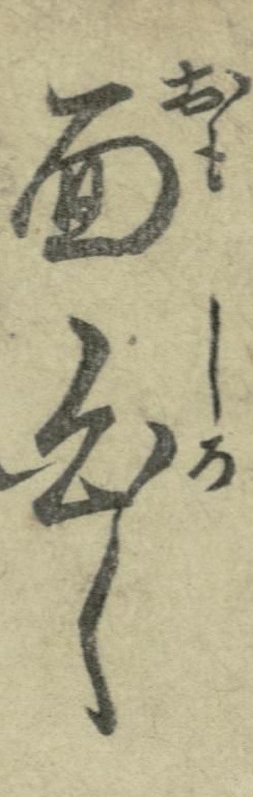面白く
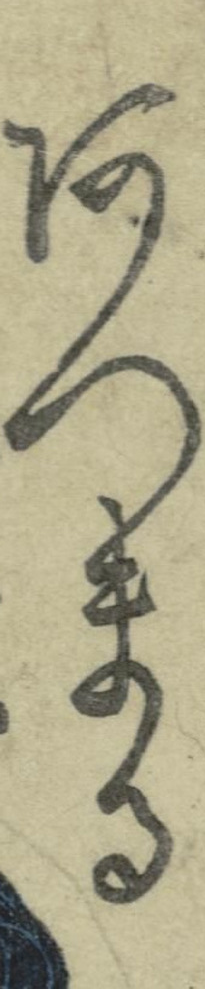あつまる
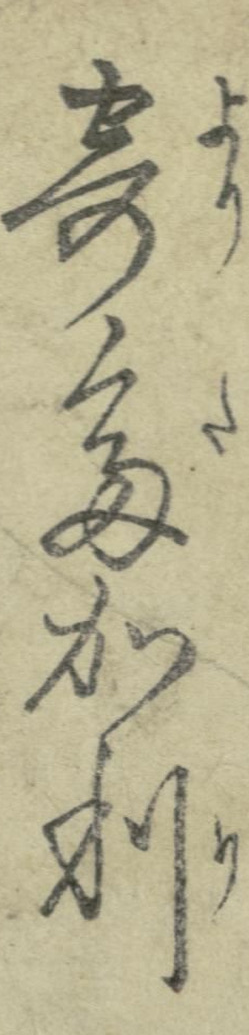寄多加利
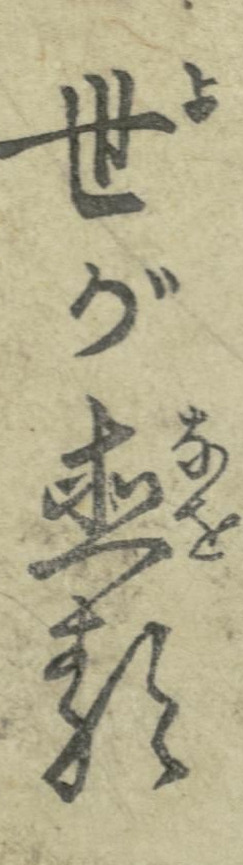世が直る
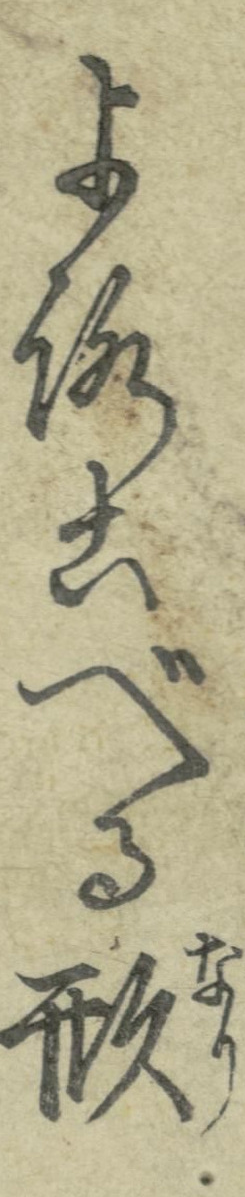よろこべる形
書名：[面白くあつまる人が]
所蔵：東京大学地震研究所図書室 Earthquake Research Institute Library, The University of Tokyo, JAPAN
